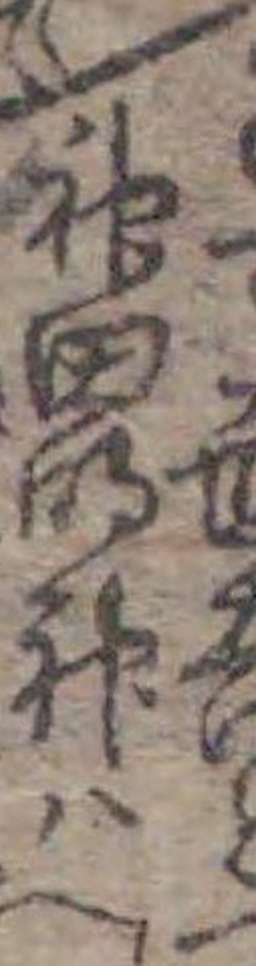神田明神は
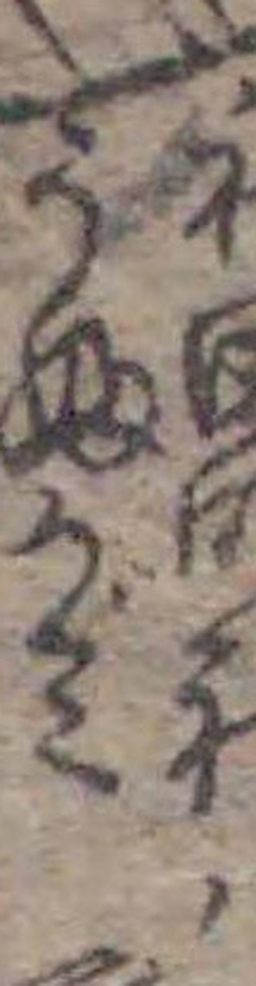うふがみ
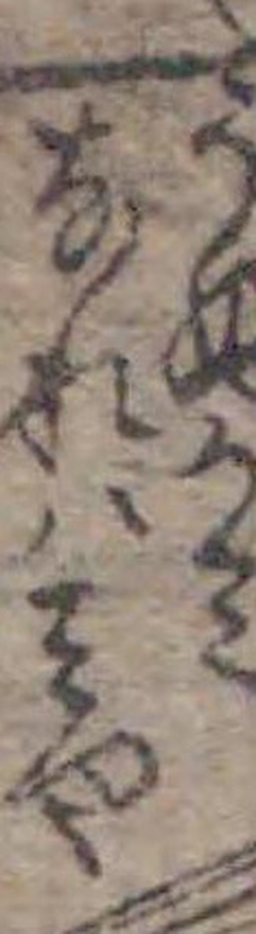なれはみや
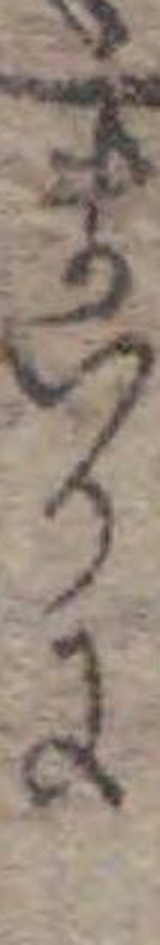まいりに
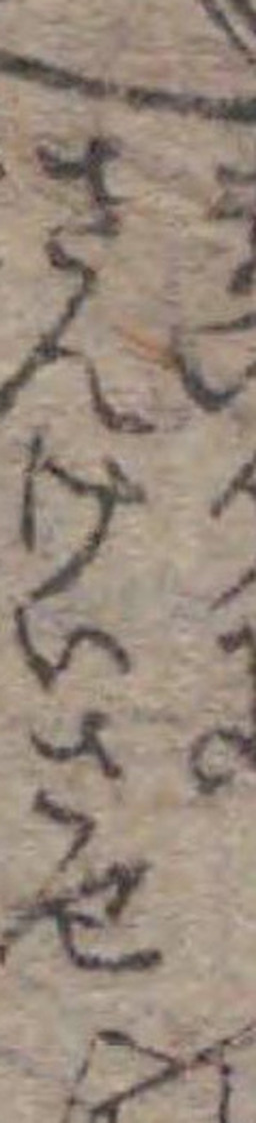さんけいさせ
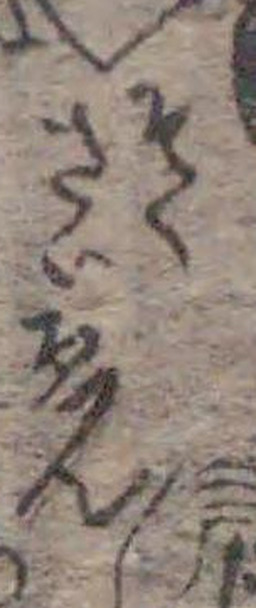さいゑん
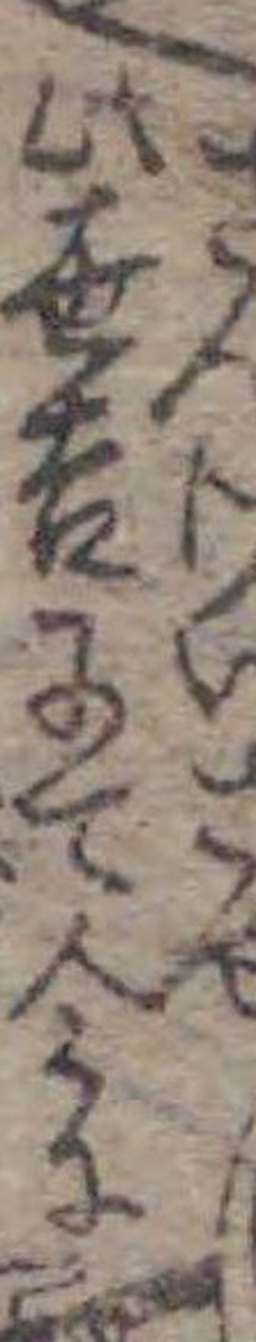此世吉にて今に
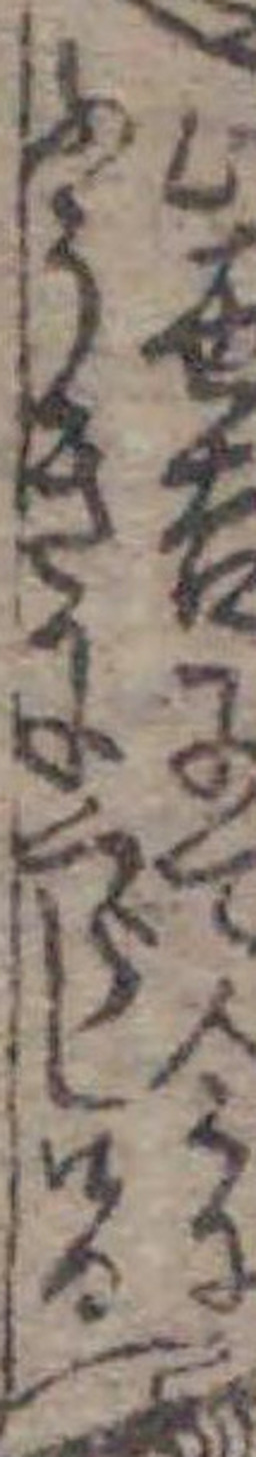ふうきにくらしける
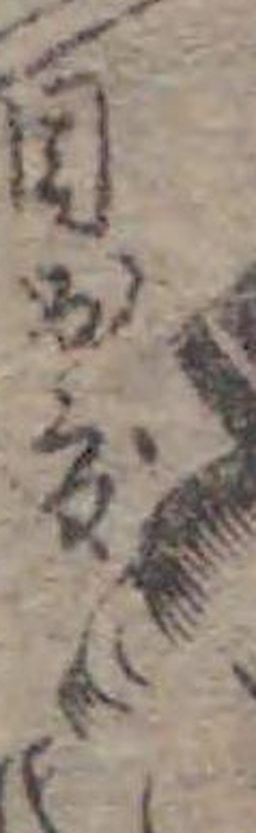目出度
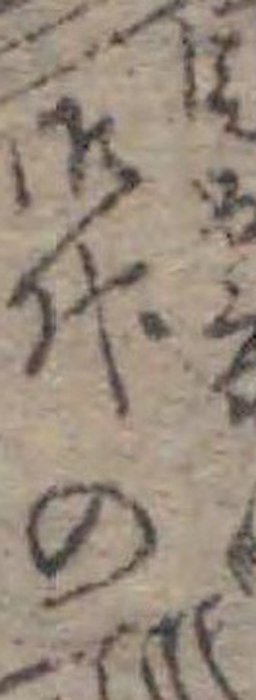御代の
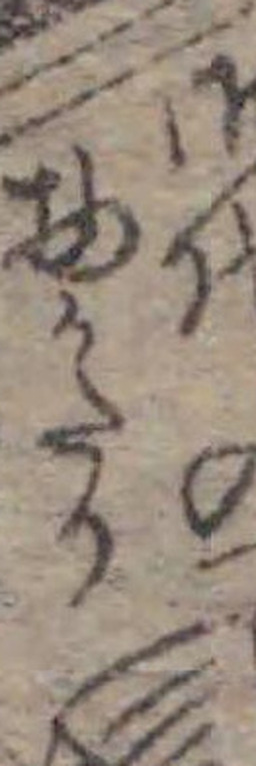物かたり
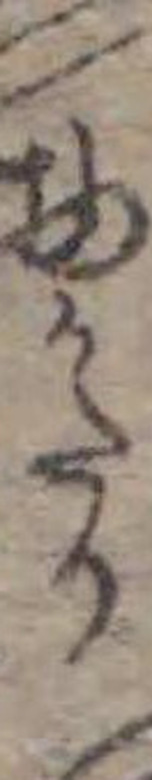物かたり
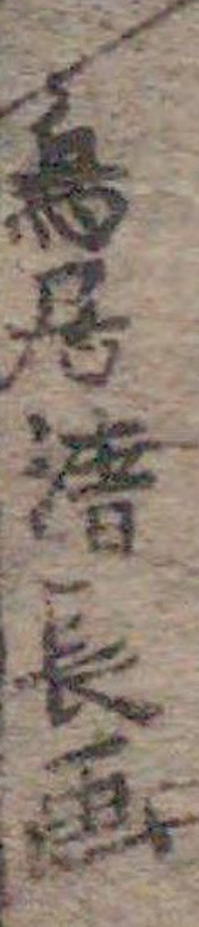鳥居清長画
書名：神田与吉一代記 : 3巻
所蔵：国立国会図書館 National Diet Library, JAPAN
